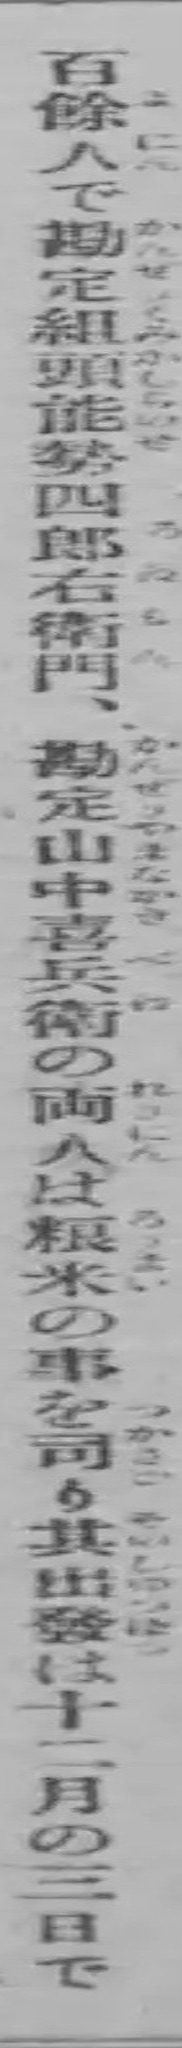百余人で勘定組頭能勢四郎右衛門、勘定山中喜兵衛の両人は粮米の事を司り其出発は十二月の三日で
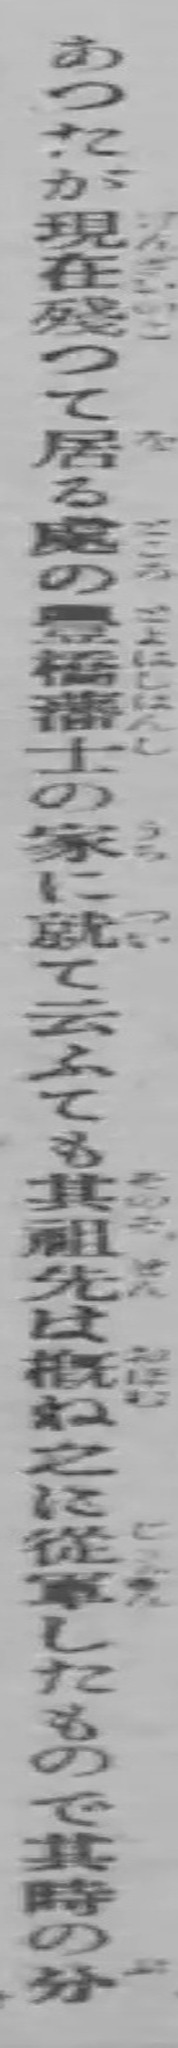あつたが現在残つて居る処の豊橋藩士の家に就て云ふても其祖先は概ね之に従軍したもので其時の分
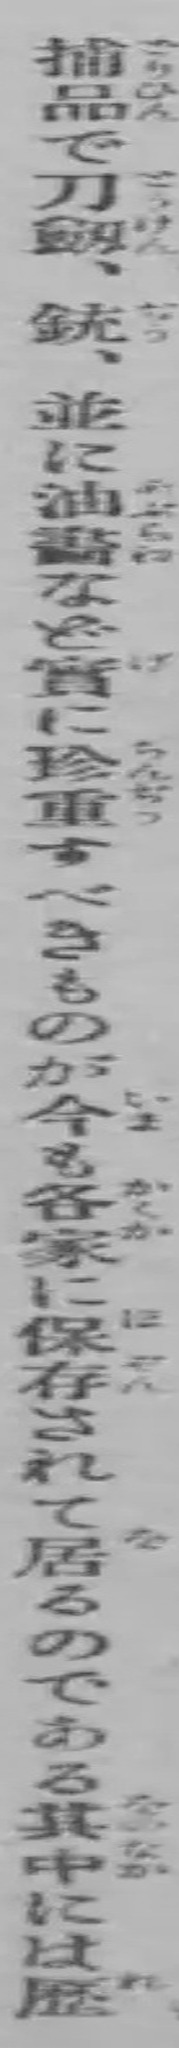捕品で刀釼、銃、並びに油画など実に珍重すべきものが今も各家に保存されて居るのである其中には歴
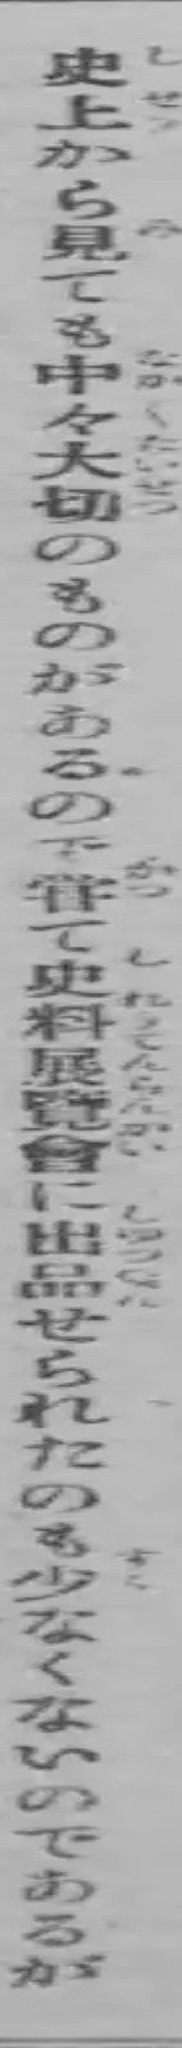史上から見ても中々大切のものがあるので嘗て史料展覧会に出品せられたのも少なくないのであるが
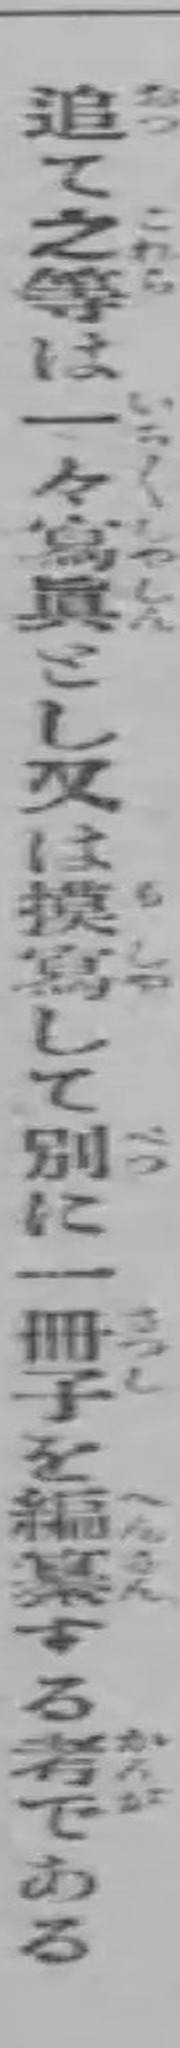追て之等は一々写真とし又は模写して別に一冊子を編纂する考である
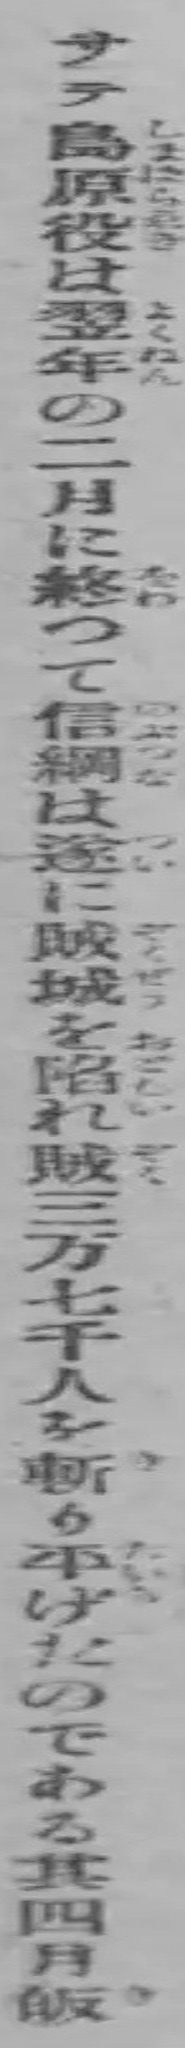サテ島原役は翌年の二月に終つて信綱は遂に賊城を陥れ賊三万七千人を斬り平げたのである其四月皈

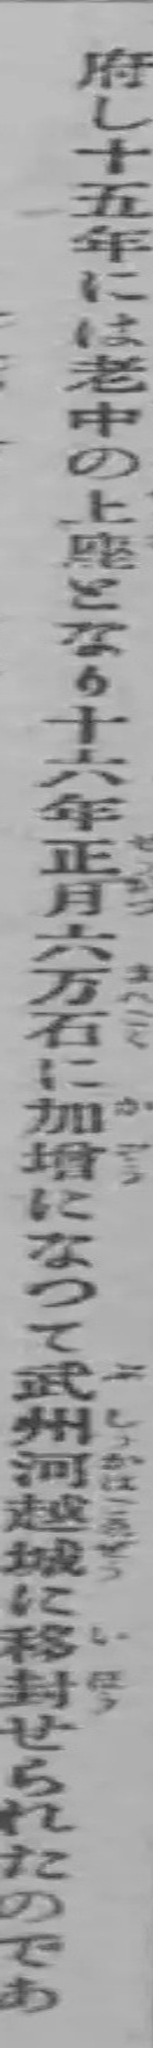府し十五年には老中の上座となり十六年正月六万石に加増になつて武州河越城に移封せられたのであ
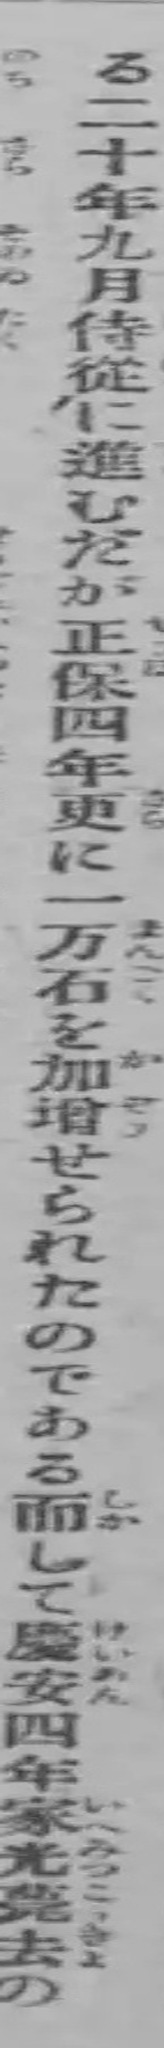る二十年九月侍従に進むだが正保四年更に一万石を加増せられたのである而して慶安四年家光薨去の
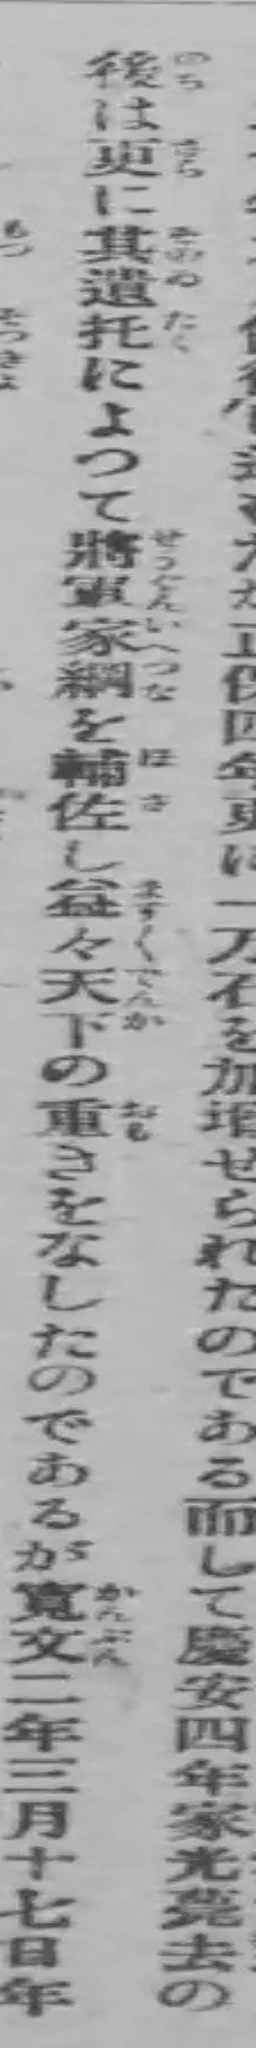後は更に其遺托によつて将軍家綱を補佐し益々天下の重きをなしたのであるが寛文二年三月十七日年
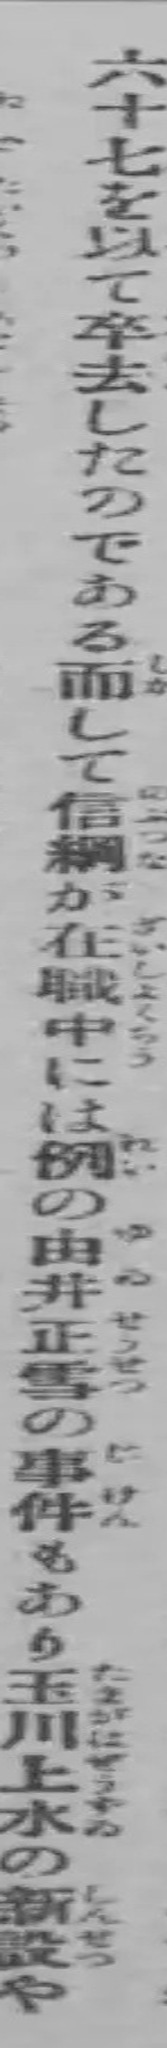六十七を以て卒去したのである而して信綱が在職中には例の由井正雪の事件もあり玉川上水の新設や
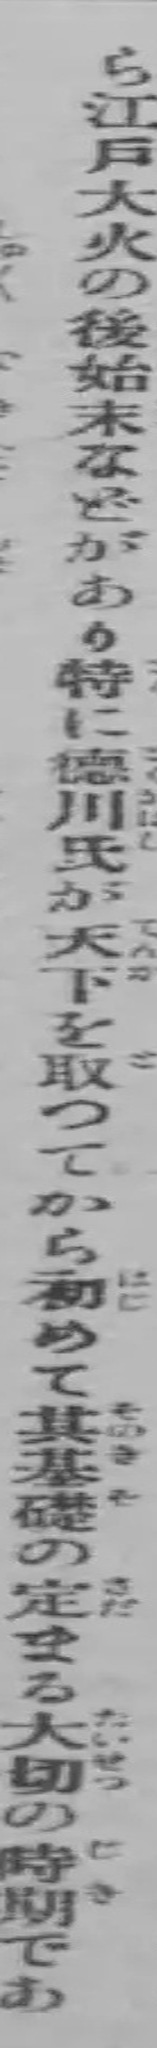ら江戸大火の後始末などがあり特に徳川氏が天下を取つてから初めて其基礎の定まる大切の時期であ
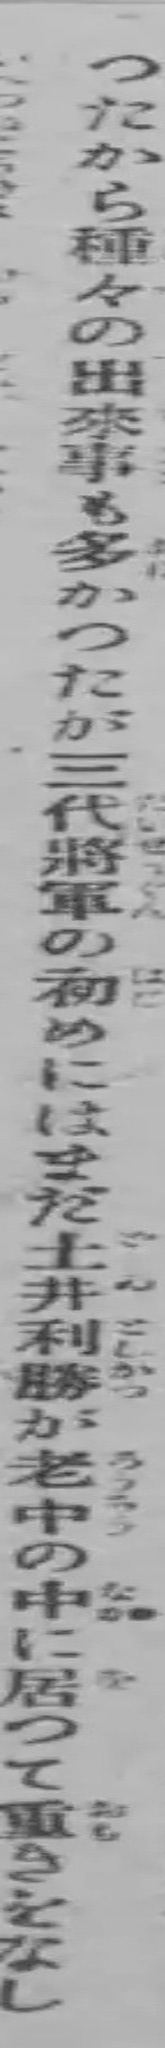つたから種々の出来事も多かつたが三代将軍の初めにはまだ土井利勝が老中の中に居つて重きをなし
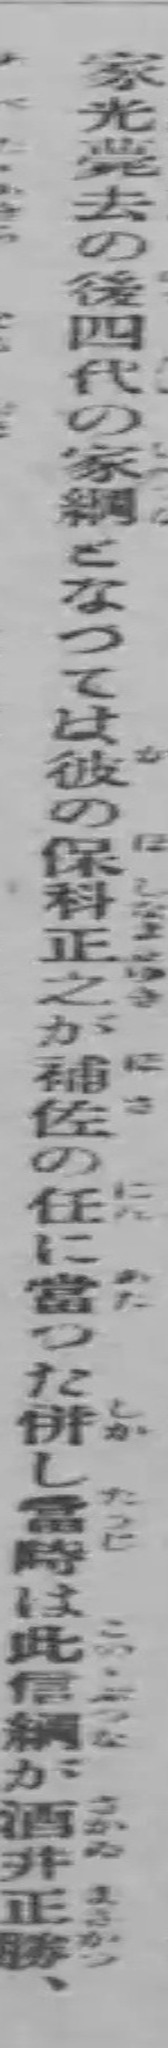家光薨去の後四代の家綱となつては彼の保科正之が補佐の任に当つた併し当時は此信綱が酒井正勝、
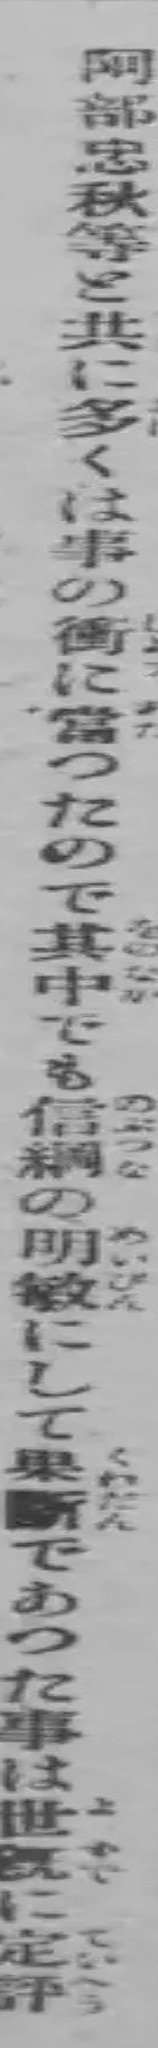阿部忠秋等と共に多くは事の衝に当つたので其中でも信綱の明敏にして果断であつた事は世既に定評
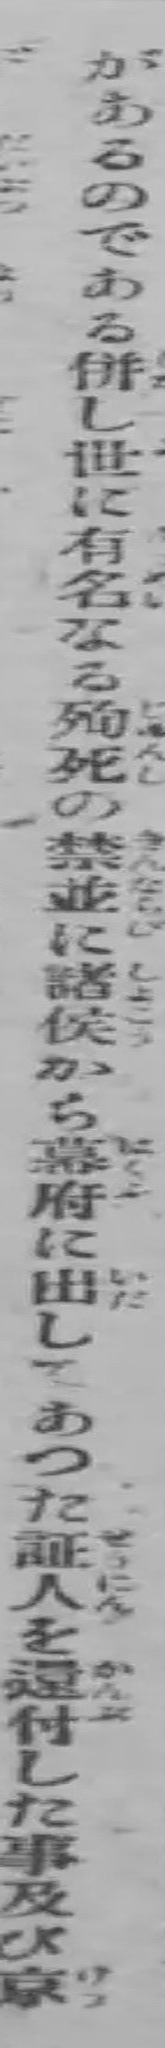があるのである併し世に有名なる殉死の禁並に諸侯から幕府に出してあつた証人を還付した事及び京
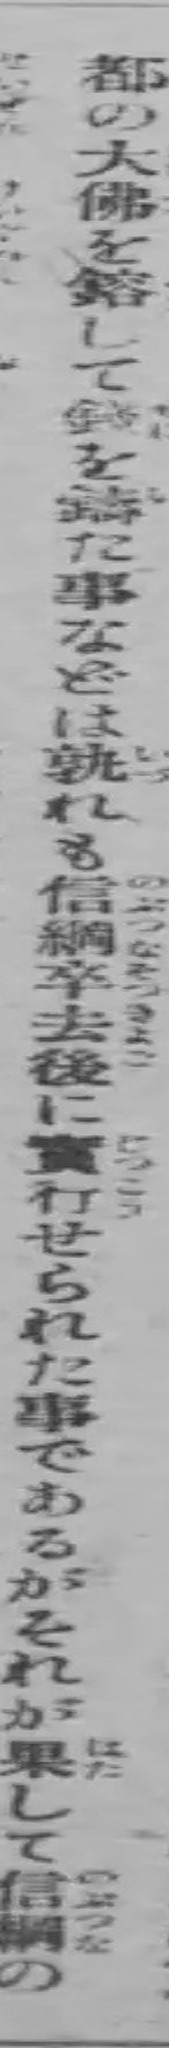都の大仏を鎔して銭を鋳た事などは孰れも信綱卒去後に実行せられた事であるがそれが果して信綱の
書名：豊橋市史談
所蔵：国立国会図書館 National Diet Library, JAPAN
